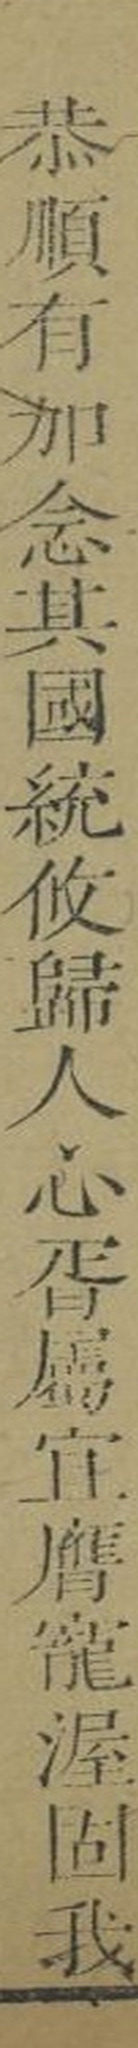恭順有加念其国統攸帰人心胥属宜膺寵渥固我
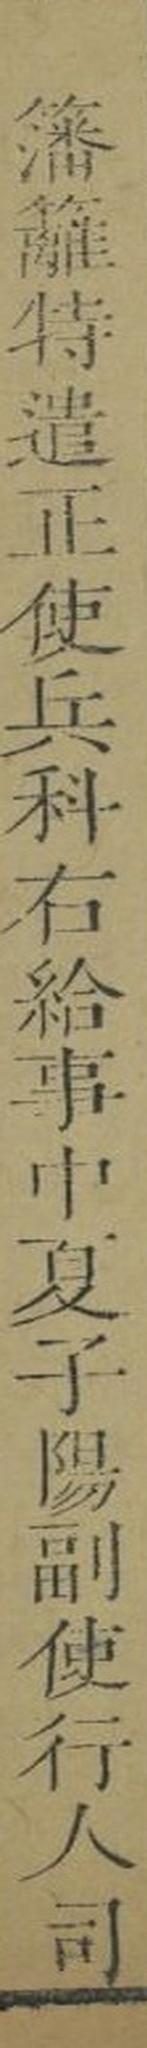籓籬特遣正使兵科右給事中夏子陽副使行人司
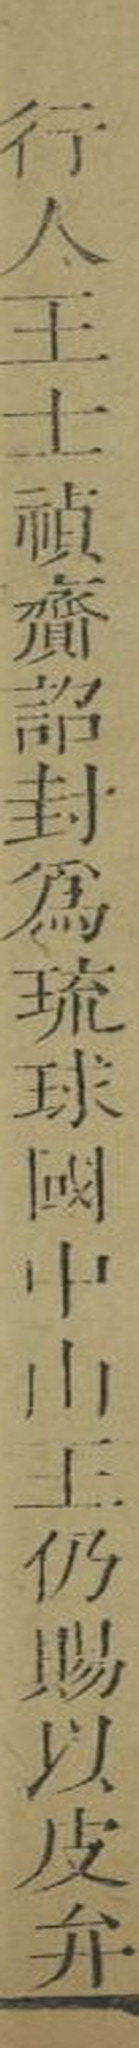行人王士禎齎詔封為琉球国中山王仍賜以皮弁
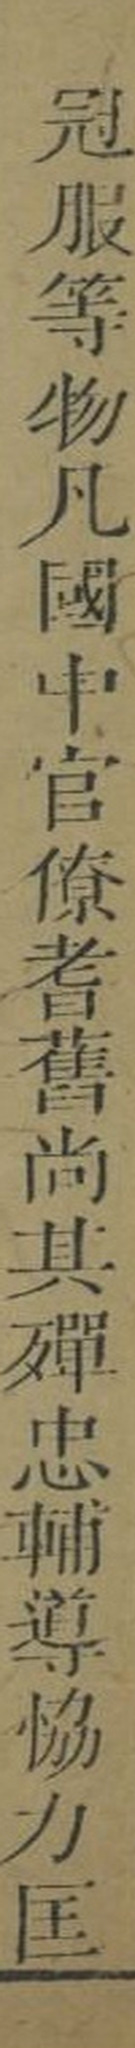冠服等物凡国中官僚耆旧尚其殫忠輔導恊力匡
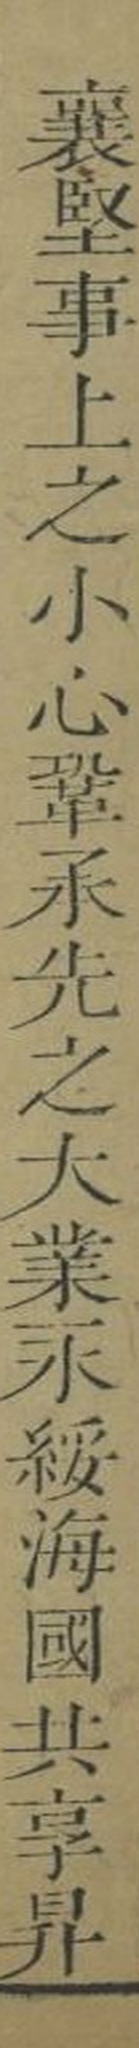襄堅事上之小心鞏承先之大業永綏海国共享昇
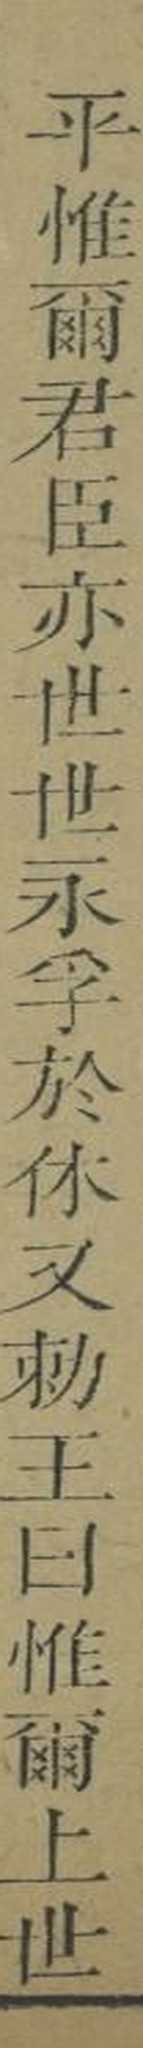平惟爾君臣亦世世永孚於休又勅王曰惟爾上世
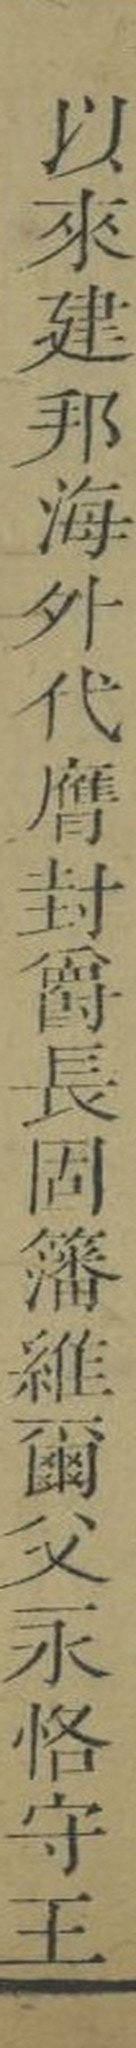以来建邦海外代膺封爵長固籓維爾父永恪守王
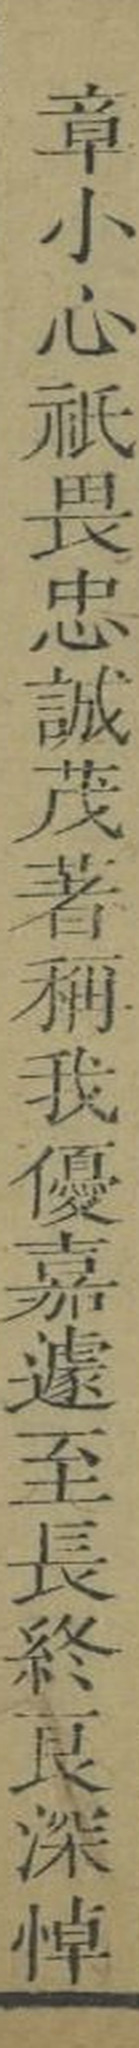章小心祇畏忠誠茂著称我優嘉遽至長終良深悼
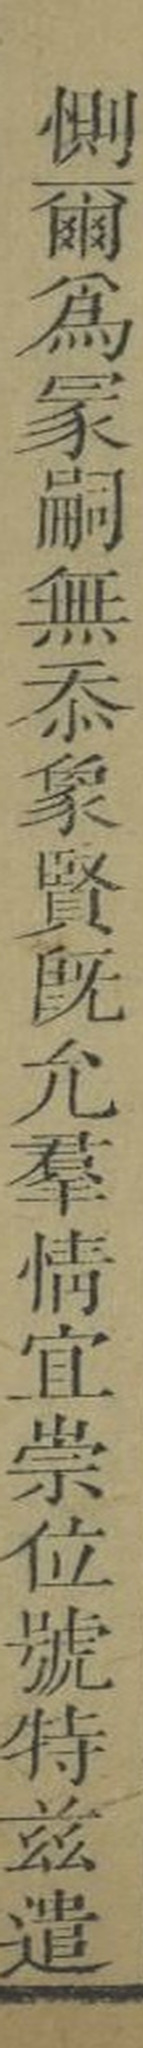惻爾為冡嗣無忝象賢既允群情宜崇位号特茲遣
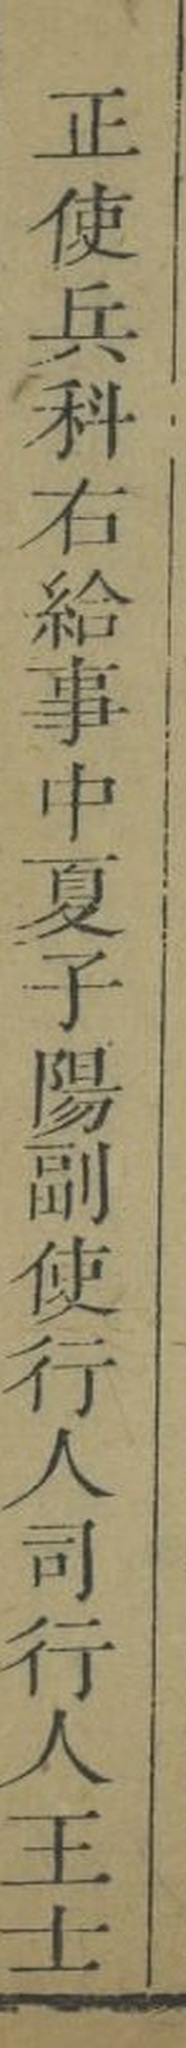正使兵科右給事中夏子陽副使行人司行人王士
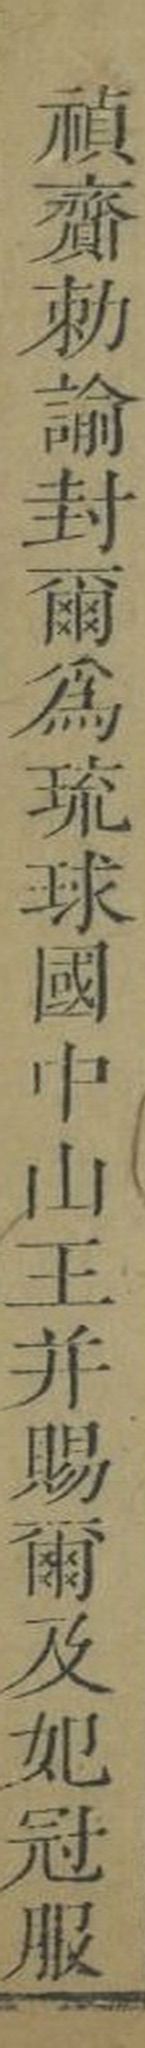禎齎勅諭封爾為琉球国中山王并賜爾及妃冠服
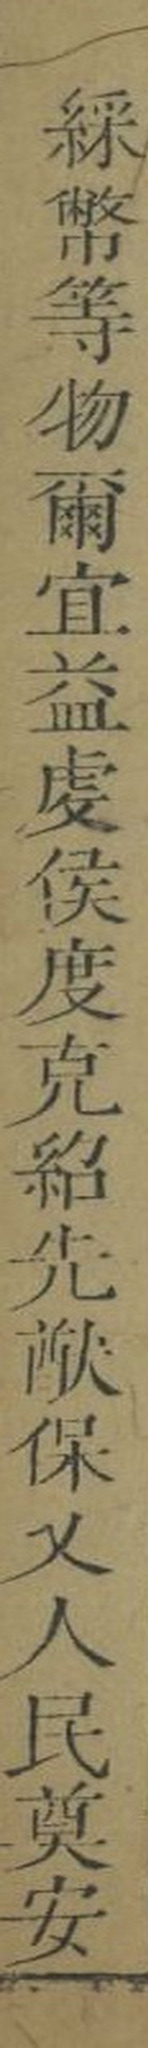綵幣等物爾宜益虔侯度克紹先猷保乂人民奠安

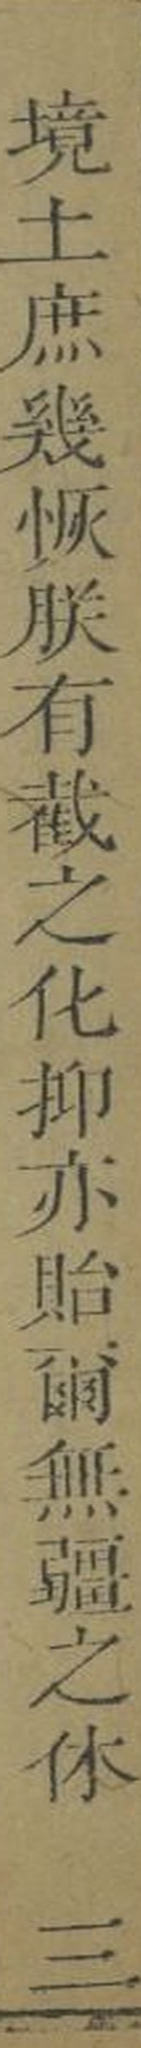境土庶幾恢朕有截之化抑亦貽爾無疆之休三
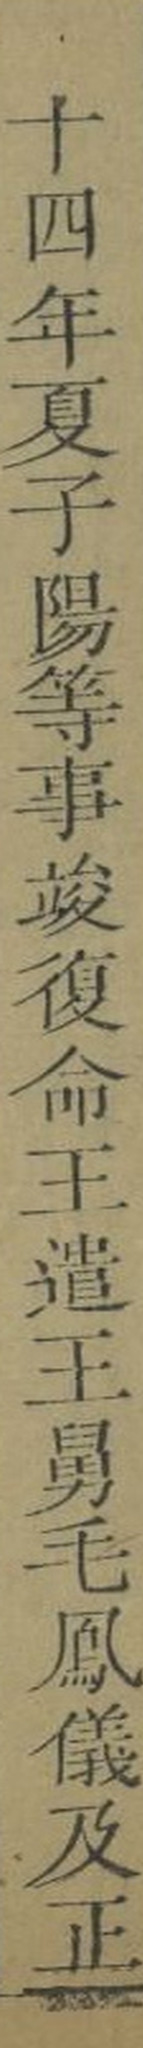十四年夏子陽等事竣復命王遣王舅毛鳳儀及正
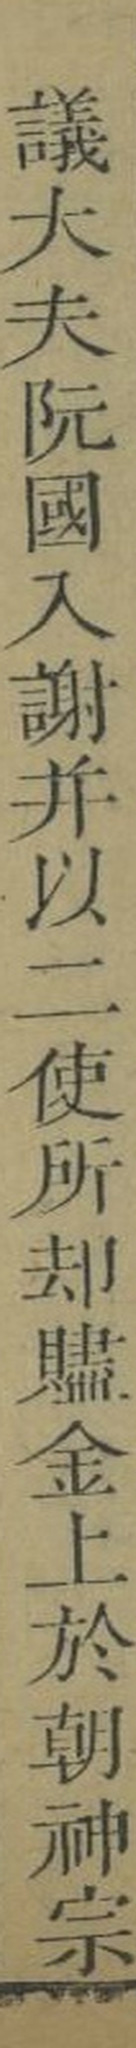議大夫阮国入謝并以二使所却贐金上於朝神宗
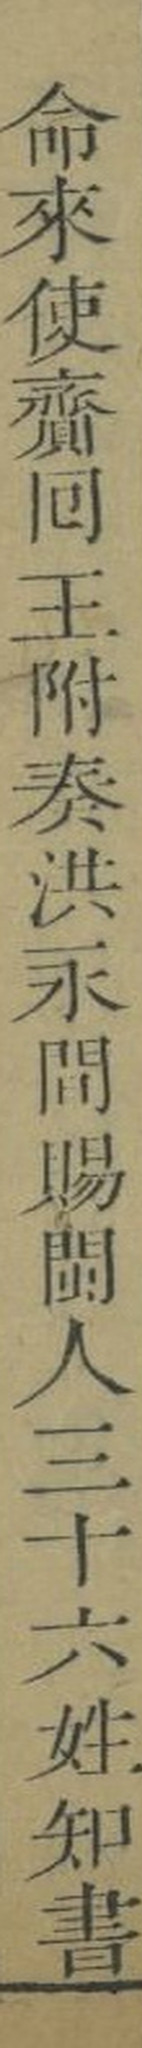命来使齎回王附奏洪永間賜閩人三十六姓知書
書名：中山伝信録 巻四
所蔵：University of the Ryukyus Library
